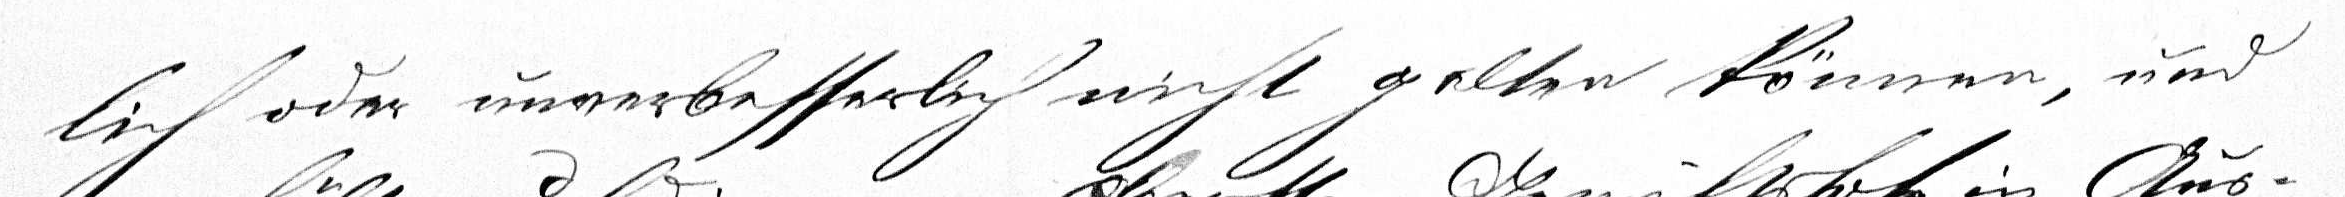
lich oder unverbesserlich nicht gellen können, und
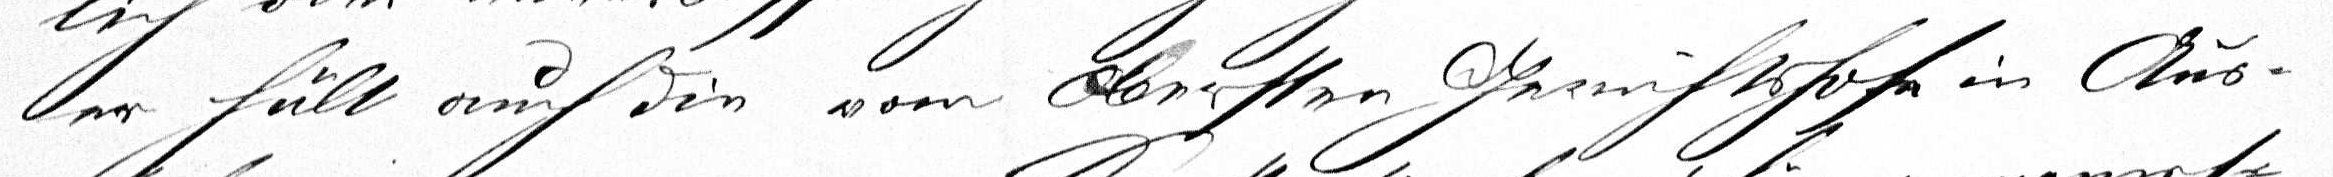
er füll auch die vom Obersten Gerichtshofe in Aus¬
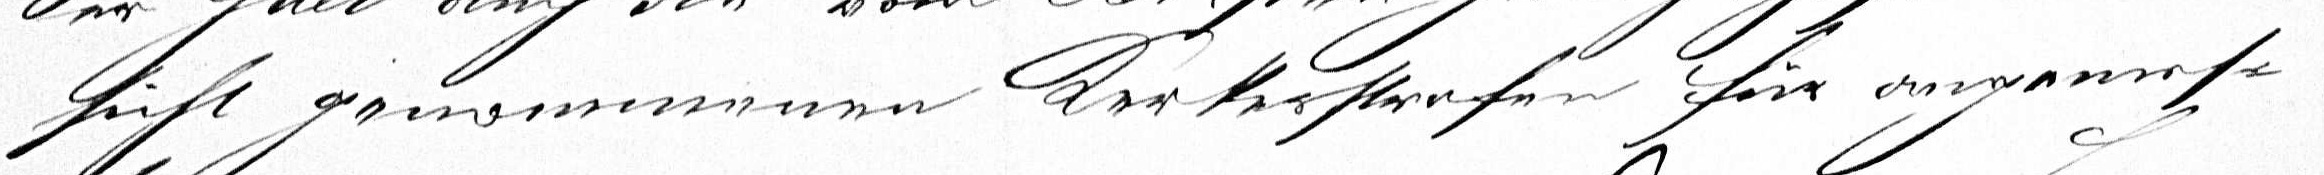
sicht genommenen Kerkerstrafen für angemes¬
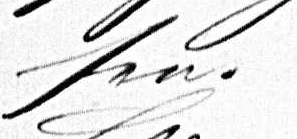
sen.
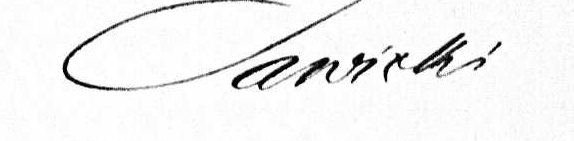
Sawicki
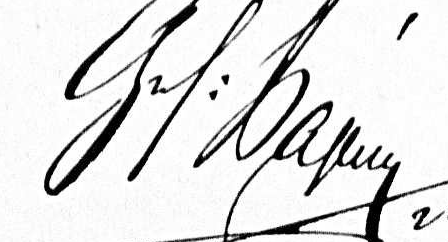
Ges: xx
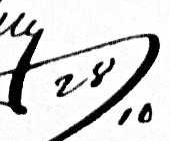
28
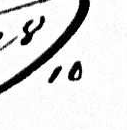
10
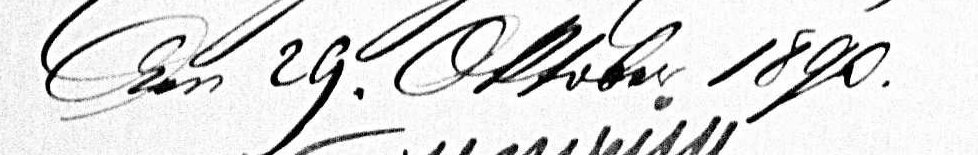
Am 29. Oktober 1890.
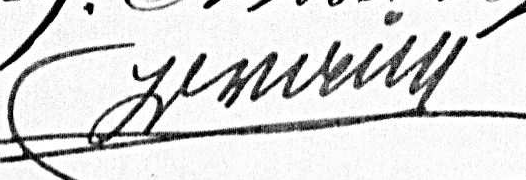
Braun
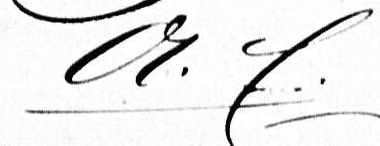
A. E.
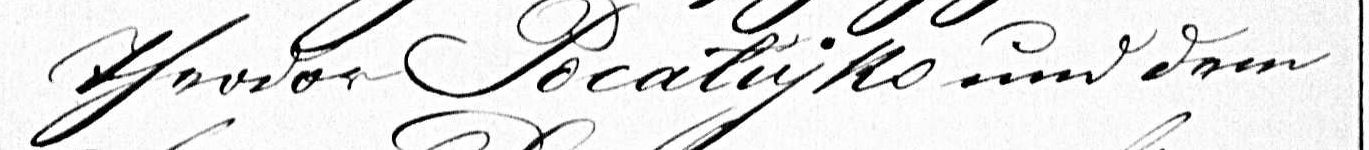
Theodor Pocatujko und dem
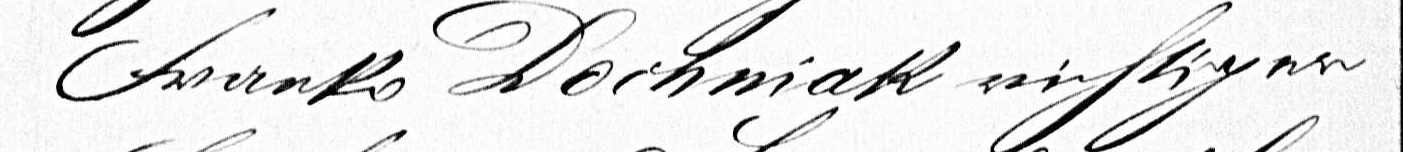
Franko Dochniak richtigen
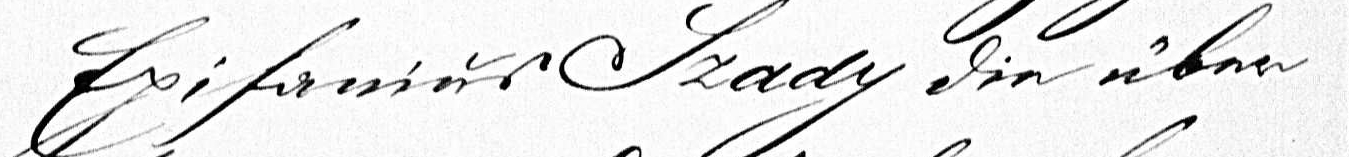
Episanius Szady die über
